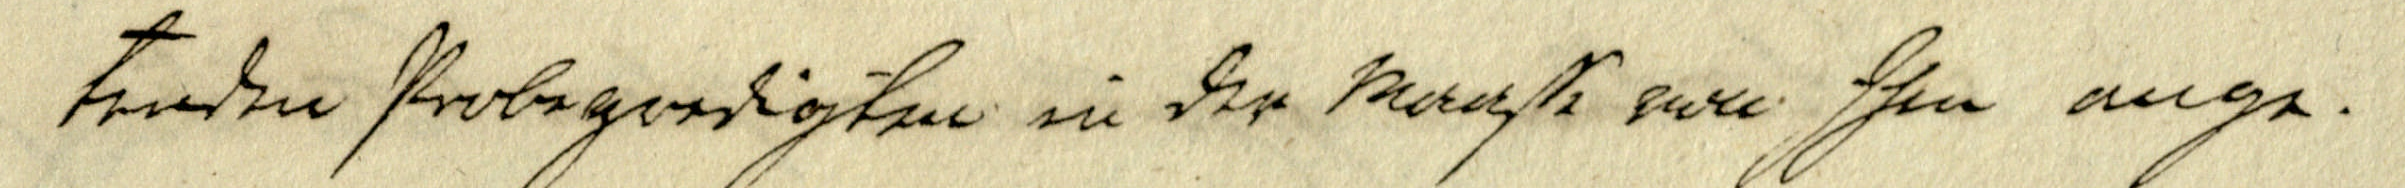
tenden Probepredigten in der Maasse von Ihm ange¬
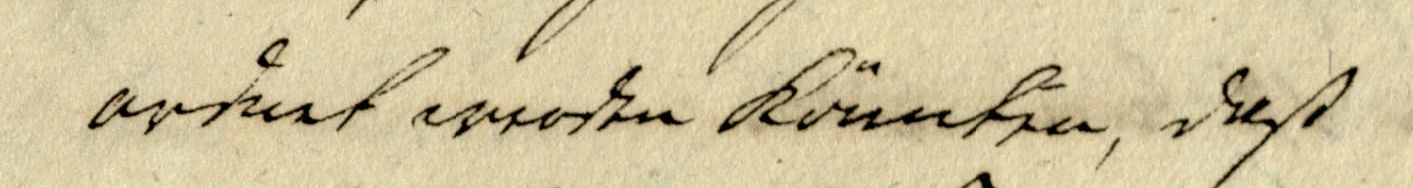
ordnet werden könnten, daß
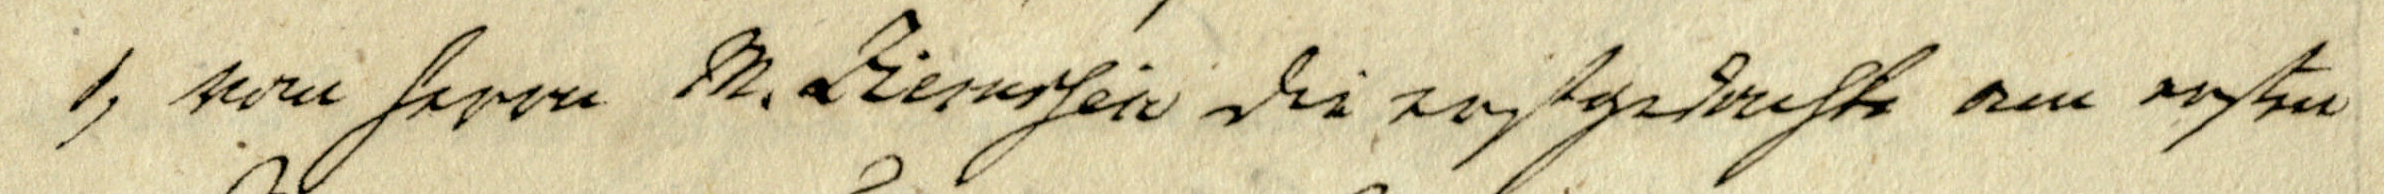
1, vom herrn M. Ziemssen die erstgedachte am ersten
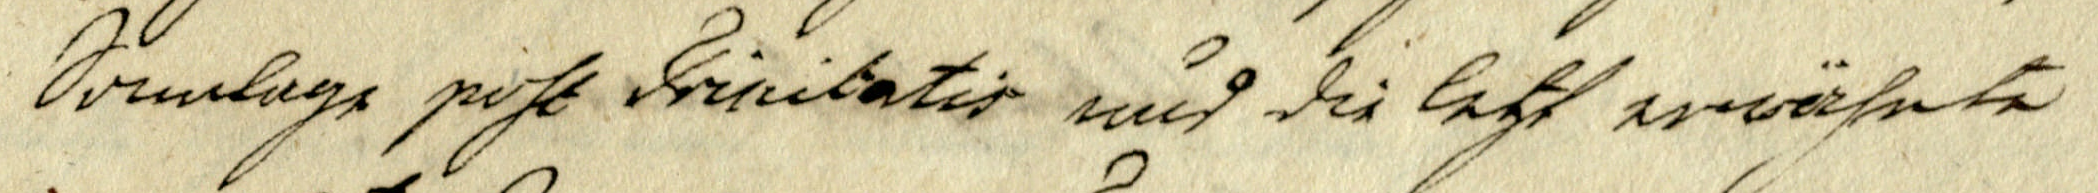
Sonntage post Trinitatis und die letzt erwähnte
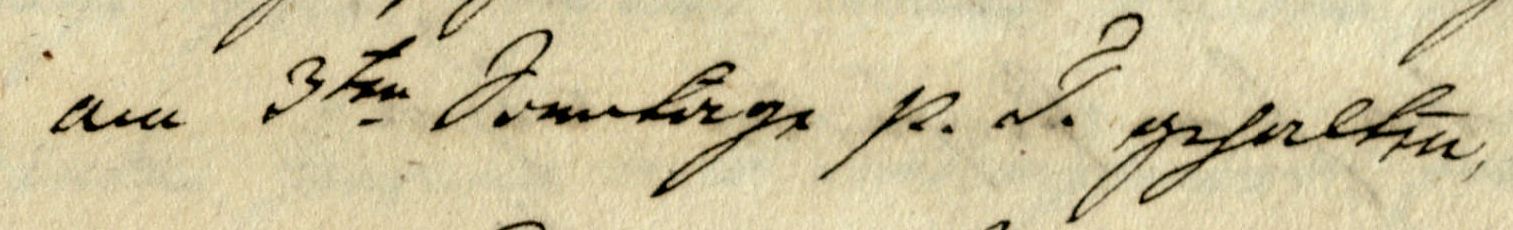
am 3 ten Sonntage p. T. gehalten
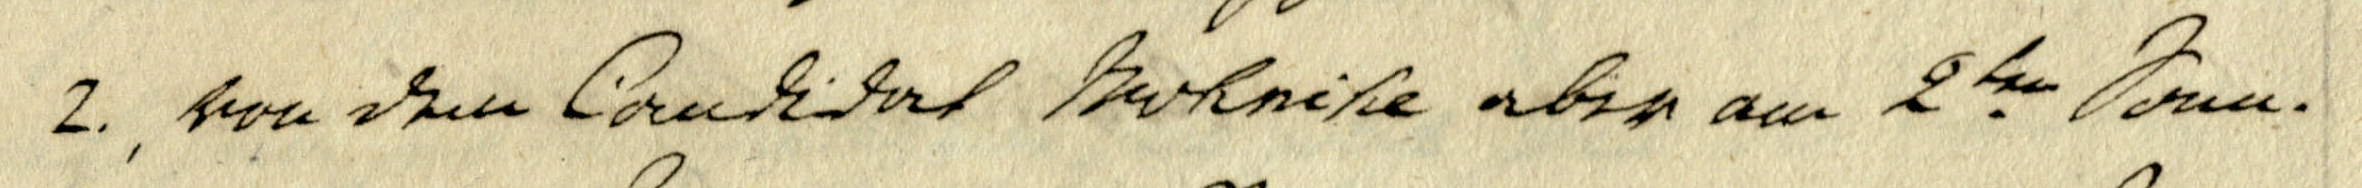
2, von dem Candidat Mohnike aber am 2 ten Sonn¬
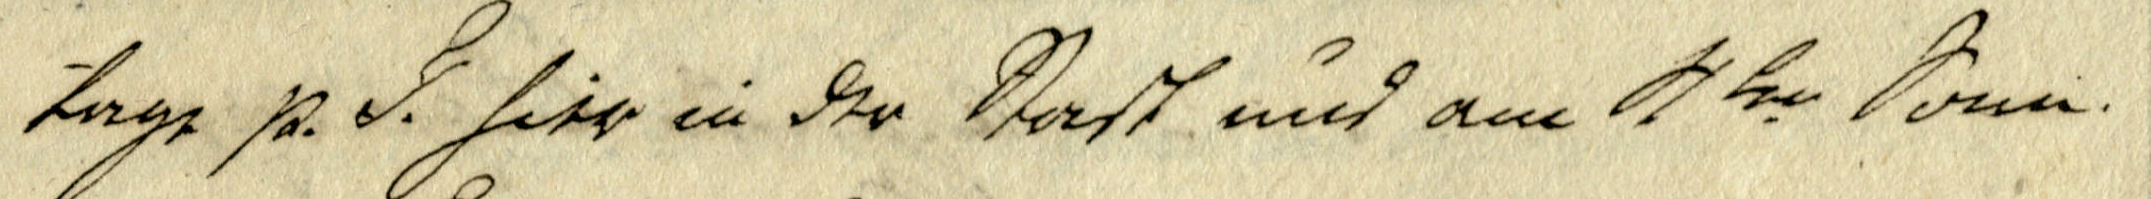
tage p. T. hier in der Stadt und am 4 ten Sonn¬
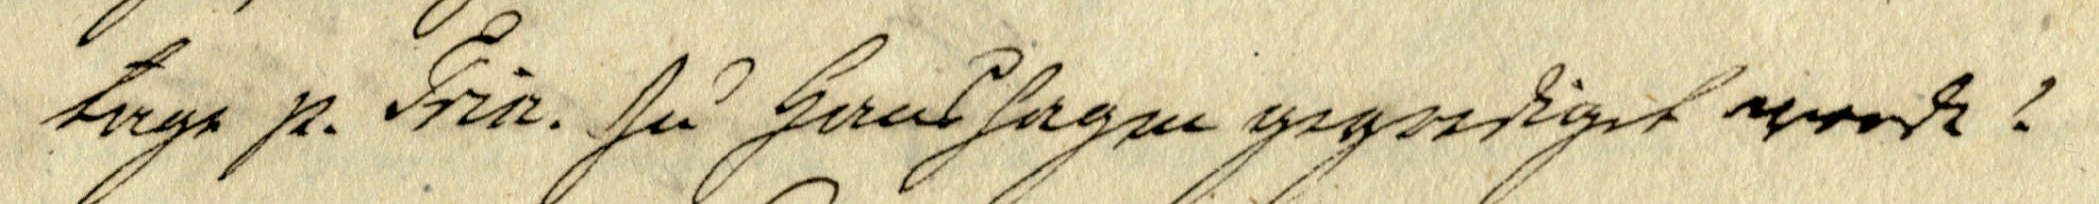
tage p. Trin. zu Hanshagen geprediget werde?
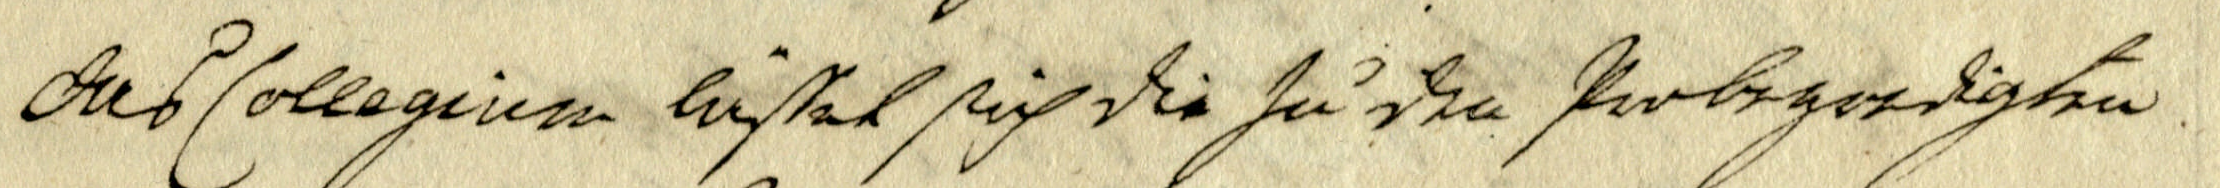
Das Collegium lässet sich die zu den Probepredigten
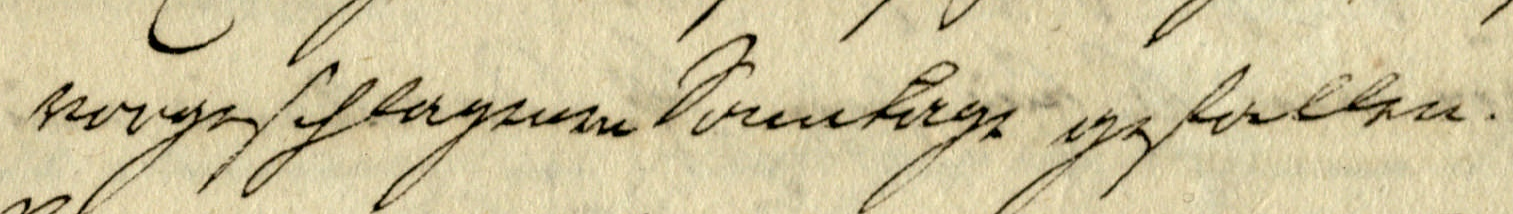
vorgeschlagenen Sonntage gefallen.
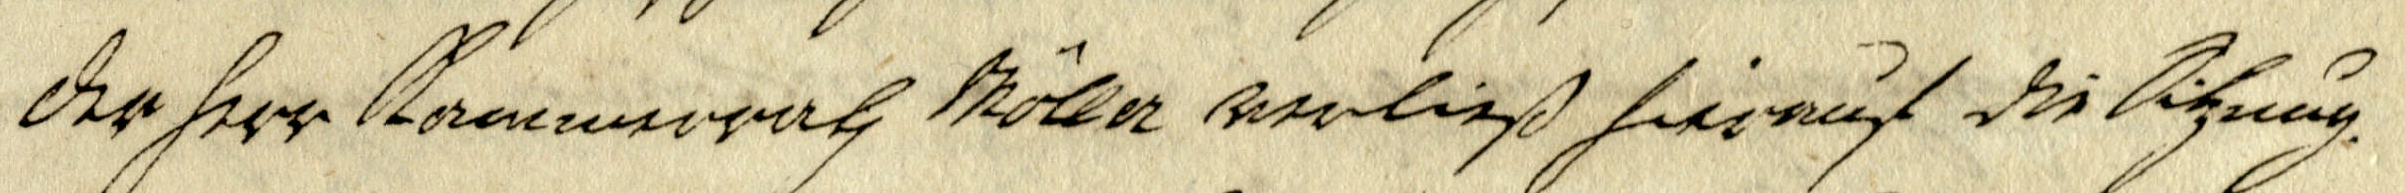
Der herr Kammerrath Möller verließ hierauf die Sitzung.
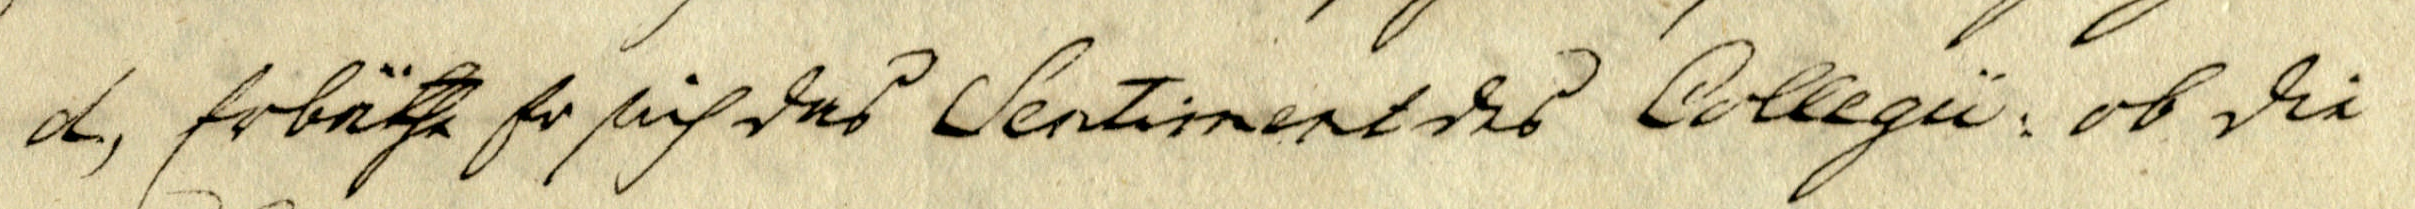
d, Erbäthe Er sich das Sentiment des Collegii: ob die
